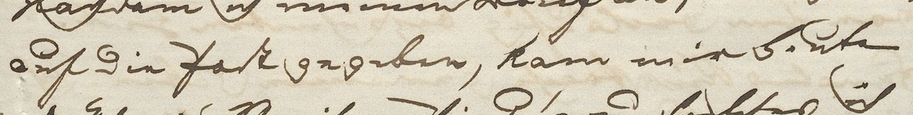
auf die Post gegeben, kam mir heute
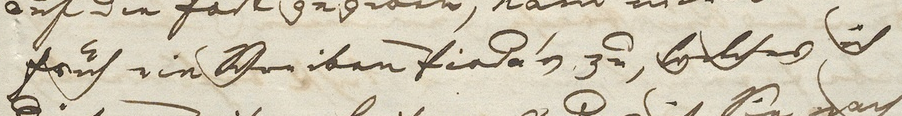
früh ein Schreiben Pioda's zu, welches ich
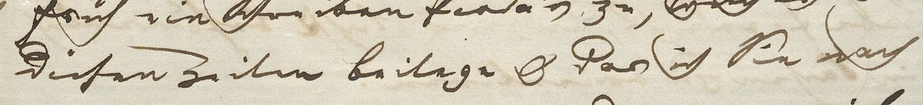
diesen Zeilen beilege & das ich Sie nach
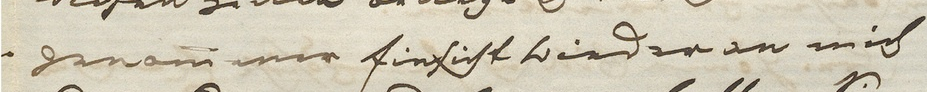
genommener Einsicht wieder an mich
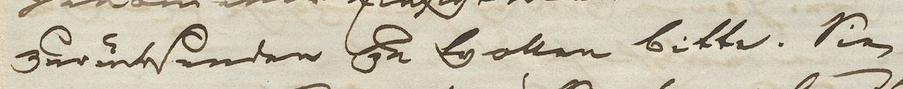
zurücksenden zu wollen bitte. Sie
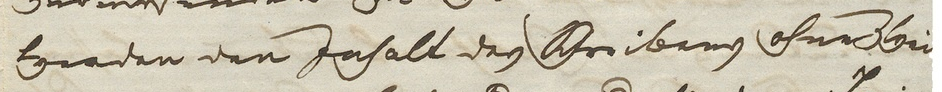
werden den Inhalt des Schreibens ohne Zwei-
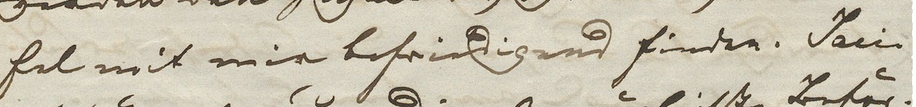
fel mit mir befriedigend finden. Jaci-
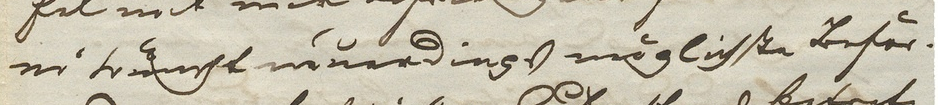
ni wünscht neuerdings möglichste Beför-
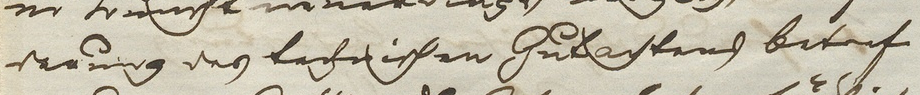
derung des technischen Gutachtens betref-
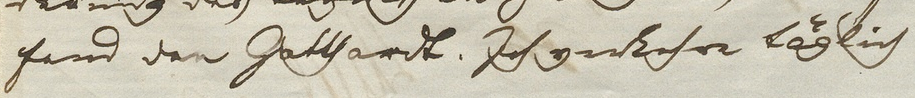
fend den Gotthardt. Ich verkehre täglich
